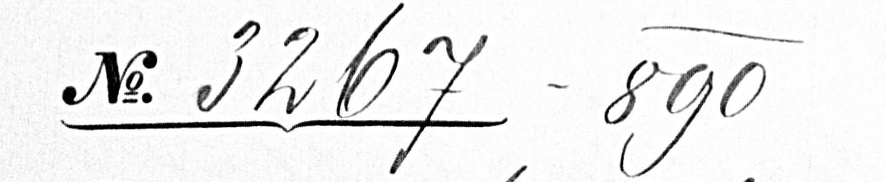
N° 3267 - 890
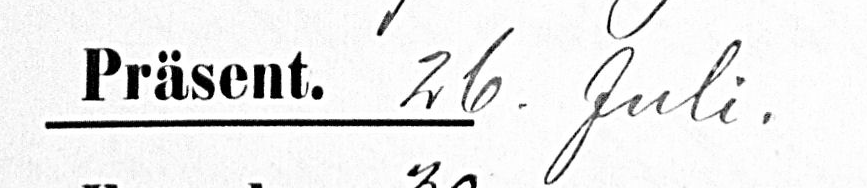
Präsent. 26. Juli.
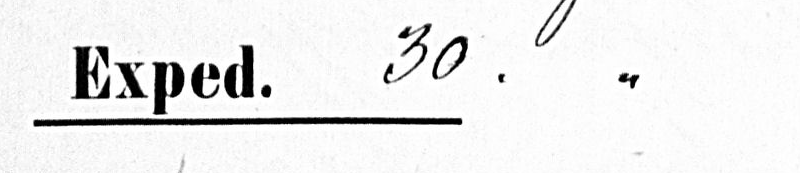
Exped. 30. Juli.
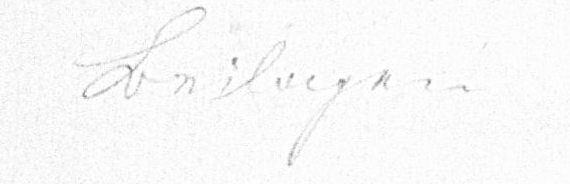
Beilagen
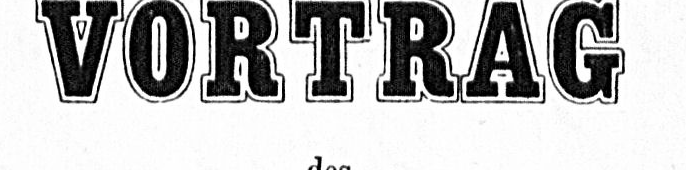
VORTRAG
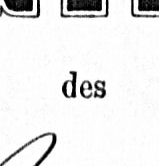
des
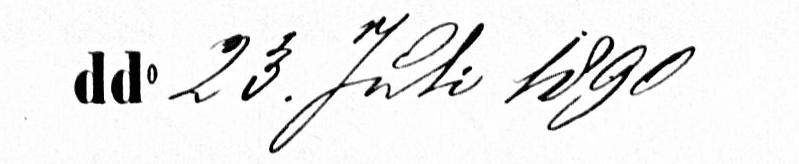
dd° 23. Juli 1890
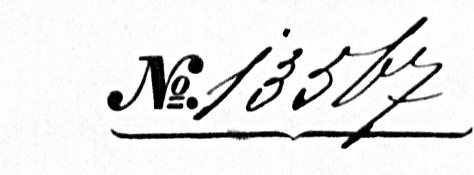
N° 13567
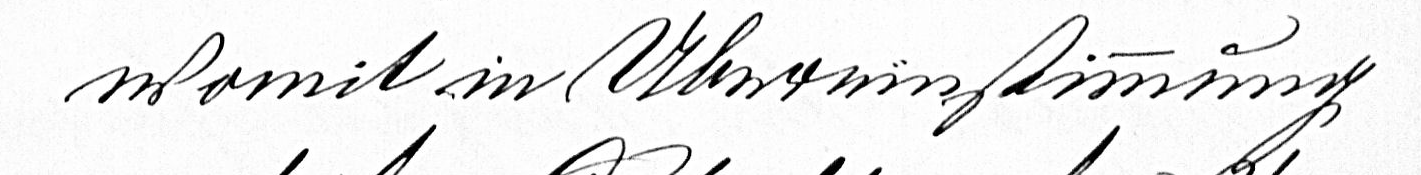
womit in Übereinstimmung
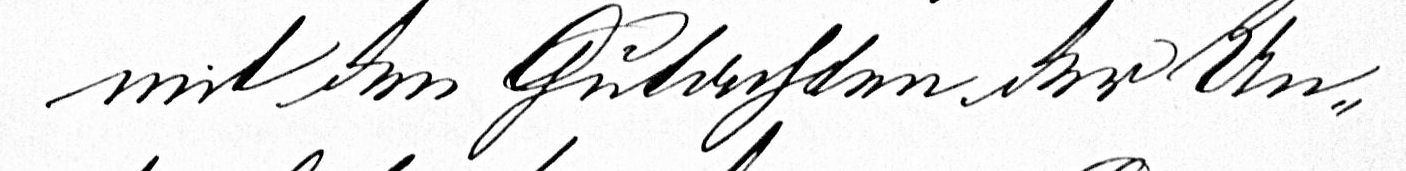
mit den Gutachten der Un¬
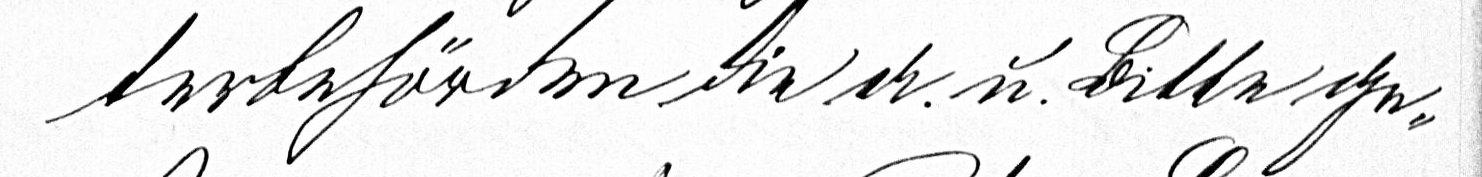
terbehörten die a. u. Bitte ge¬
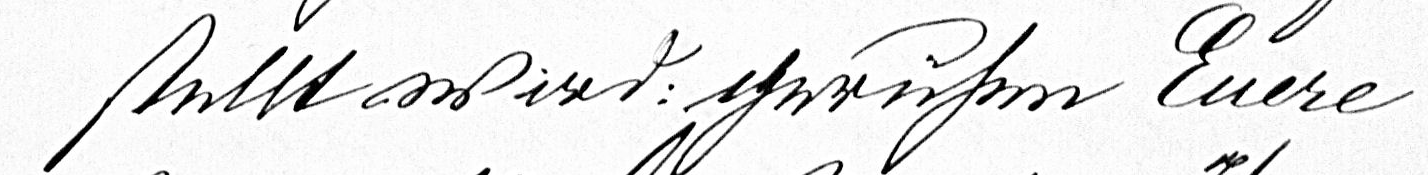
stellt wird: geruhen euere
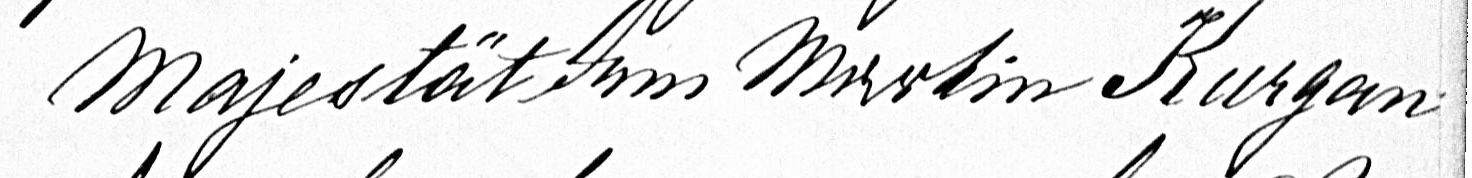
Majestät dem Martin Kurgan
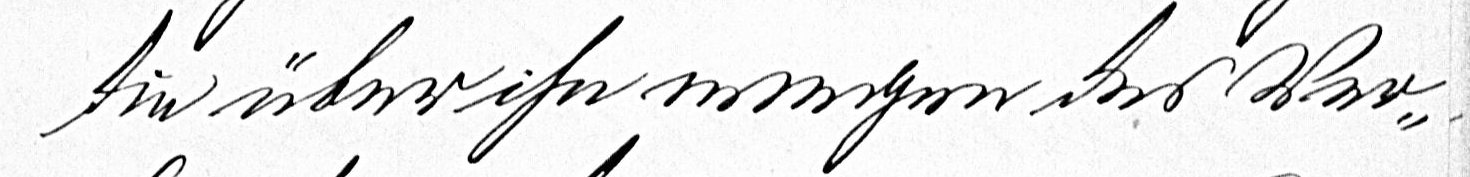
die über ihn wegen des Ver¬
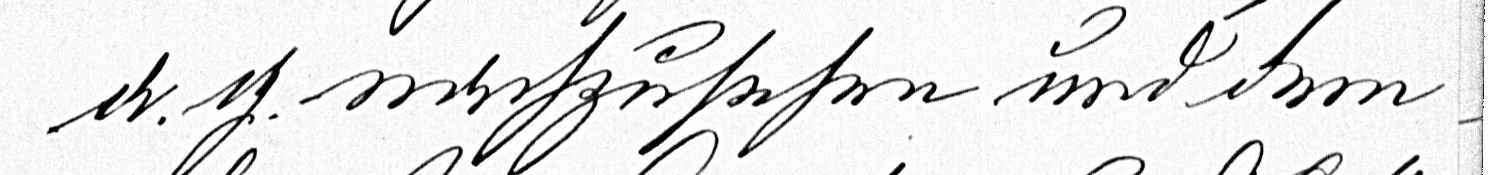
a. g. nachzusehen und dem
